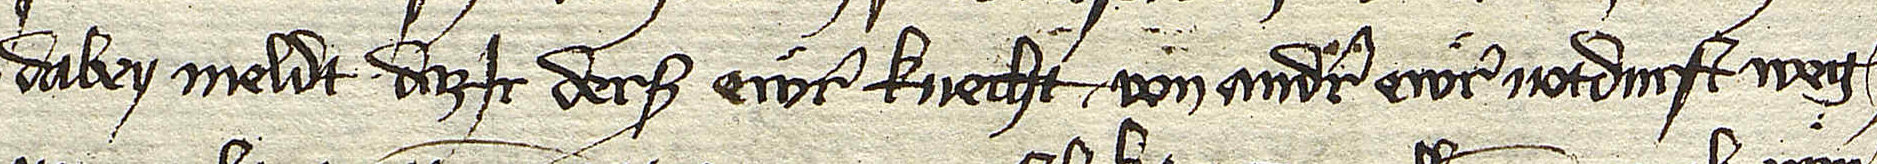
dabey meldt . daʒ Ir derſ* ew*r knecht / von and*r ew*r notdurft weg*
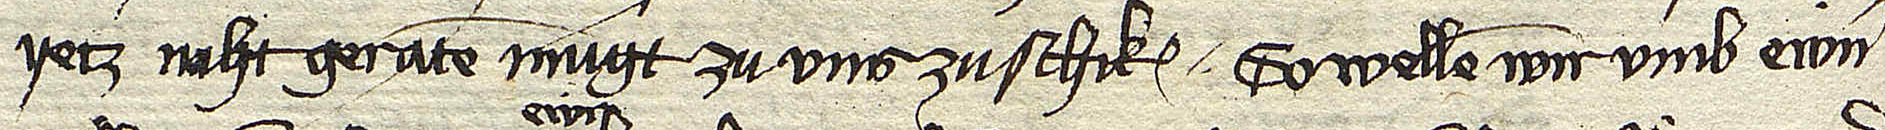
yecʒ niht gerate* mugt ʒu vns ʒuſchik* / . So welle* wir vmb ew*n
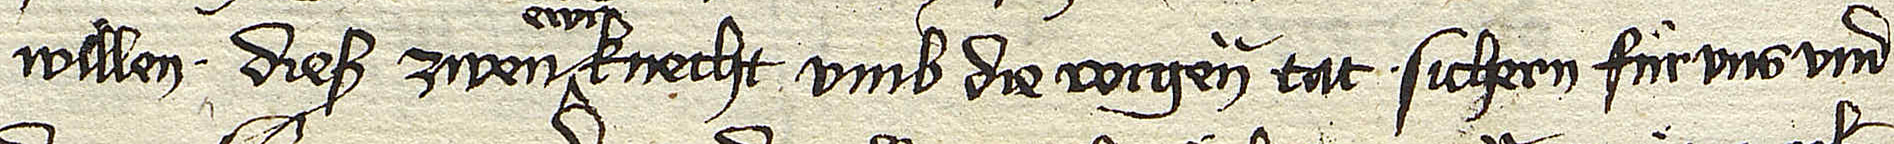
willen . dieſ* ʒwen knecht vmb die vorgen* tat . ſichern für vns vnd
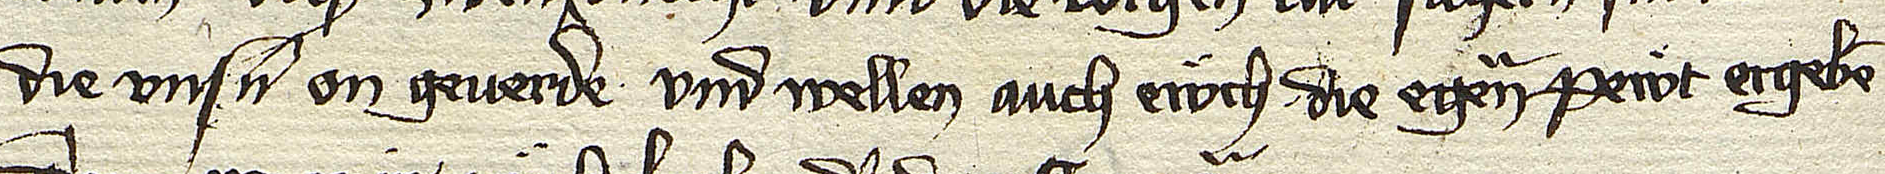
die vnſ*n on geuerde . vnd wellen auch ewch die egen* Pewt ergebe*
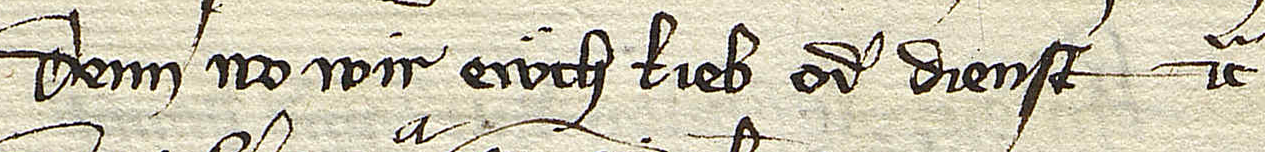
Denn wo wir ewch lieb od* dienſt ec*
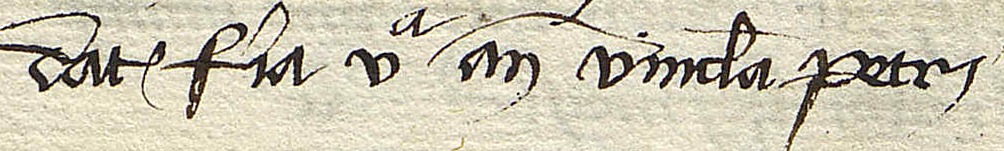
Dat* fia* v* an* vincla* Petri
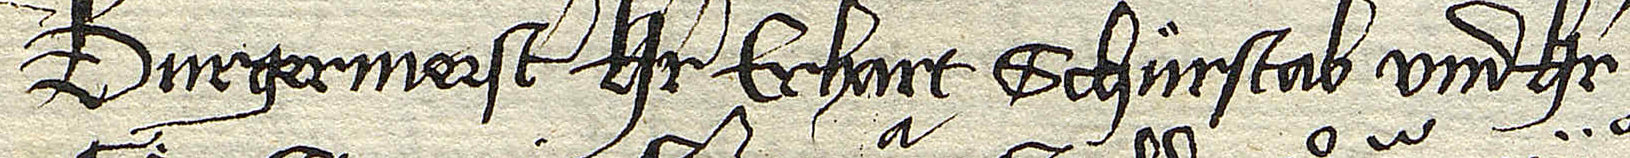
Burgermeiſt* H*r Erhart Schürſtab vnd H*r
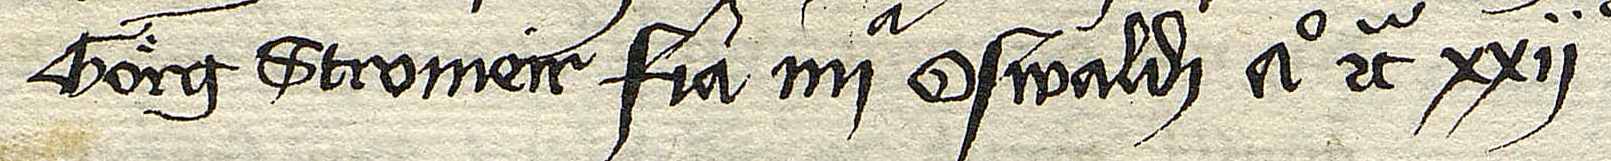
Görg Stromeir fia* iiii* Oſwaldi a* ec* xxii*
